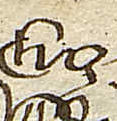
Ercʒ
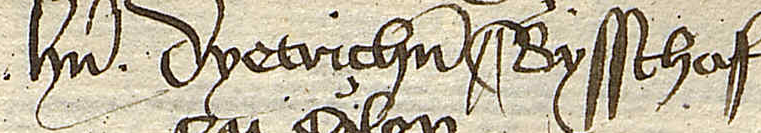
hn* Dyetrichn Byſſchof
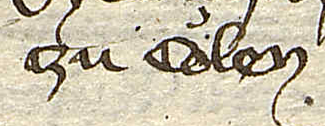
cʒu Cölen
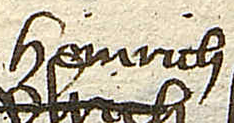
heinrich
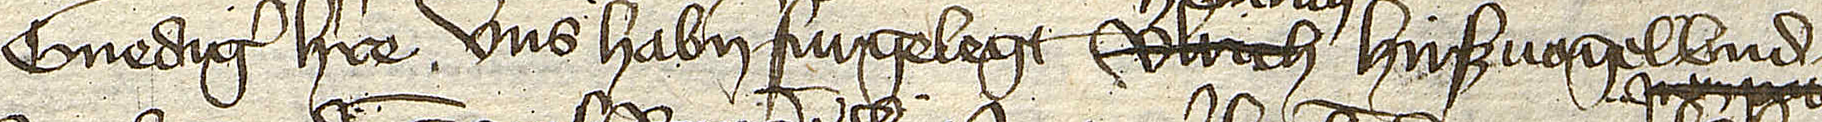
Gnedig* h*re . Vns habn* fürgelegt Vlrich hirſʒuogel vnd
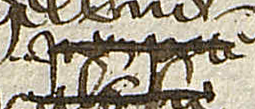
Iren pote*
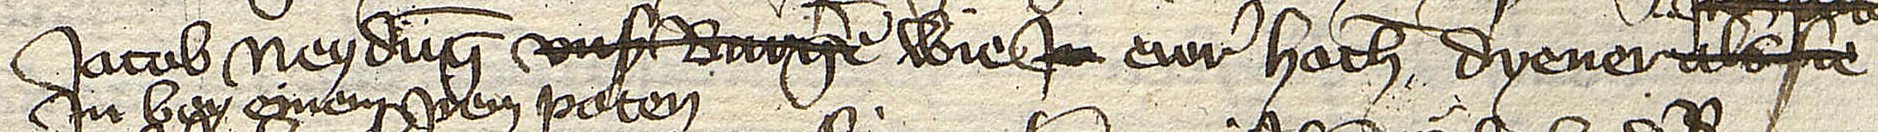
Iacob Neydu*g vnſ* Burge* wie Ir ewr* hoch* dyener als ſie
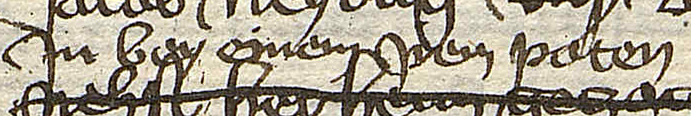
In bey einem Irem poten
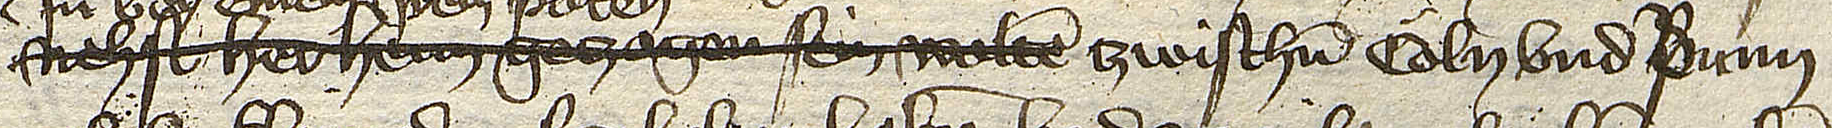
nehſt herhein gecʒogen ſein wolte* cʒwiſchn* Cöln vnd Bunn
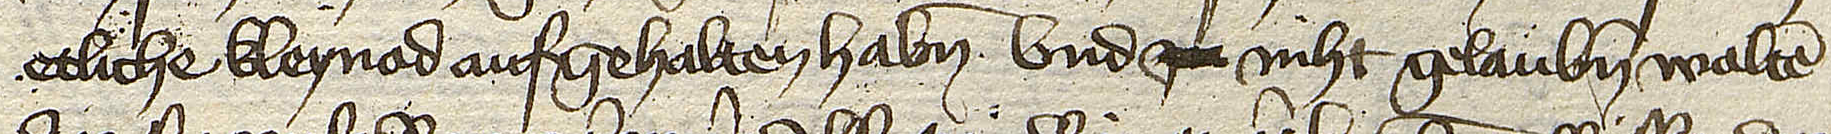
etliche kleynod aufgehalten habn* . vnd In niht gelaubn* wolte*
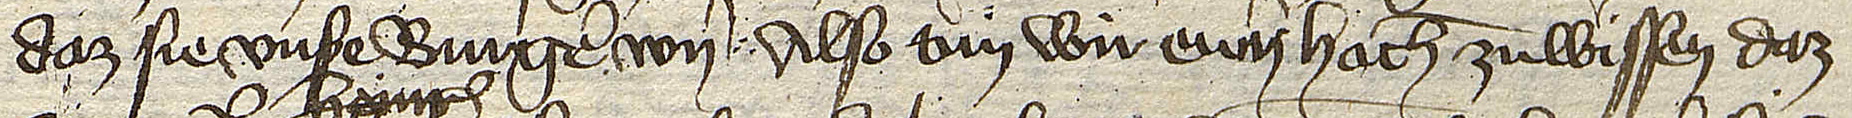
daʒ ſie vnſ*e Burge* wn* Alſo tun wir ew*n hoch* cʒuwiſſen daʒ
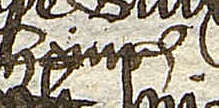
heinr*
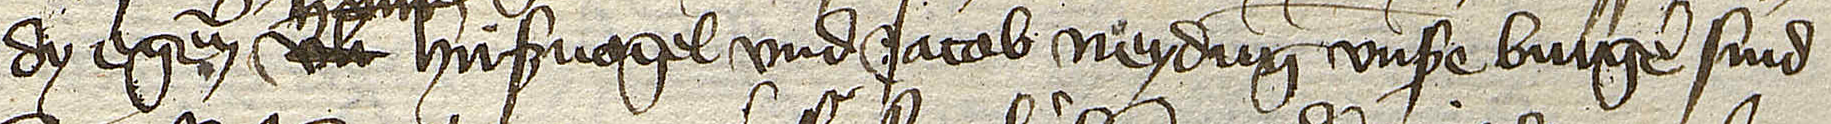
dy egen* vlr hirſʒuogel vnd Iacob neydu*g vnſ*e burge* ſind
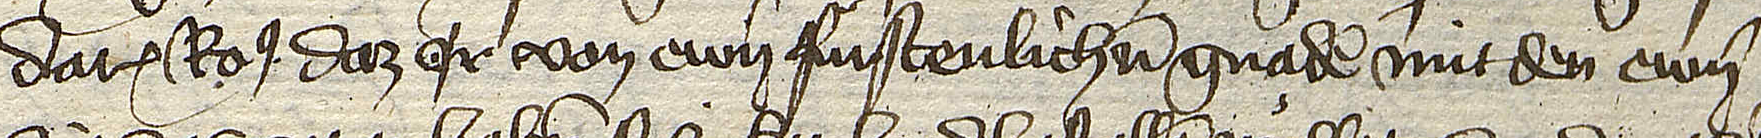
Dar* Ro* daʒ Ir von ew*n fürſtenlichn* gnade* mit den ewn*
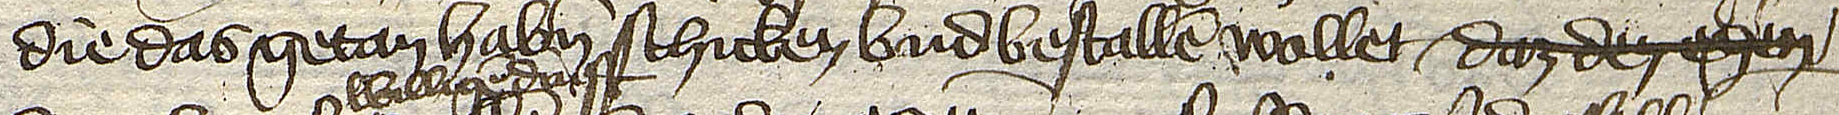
die das getan habn* ſchicken vnd beſtalle* wöllet / daʒ den egen*
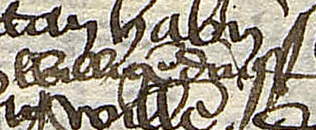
willige* dinſt
